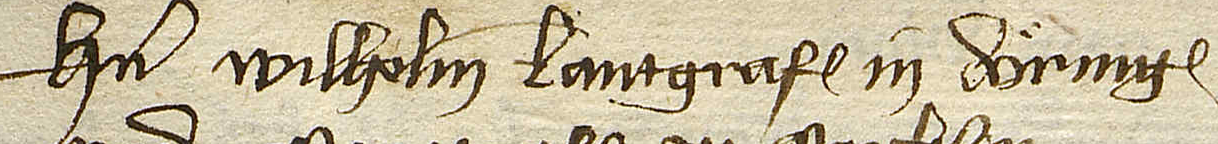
Hn* wilhelm* lantgraf* in Döring*
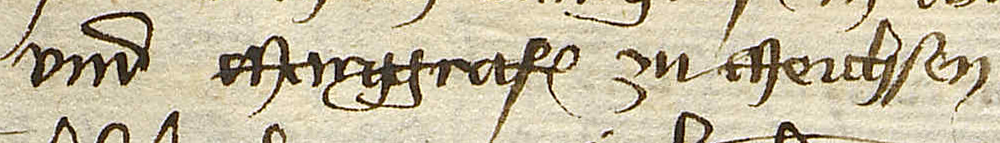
vnd Marggraf* ʒu Meichſen
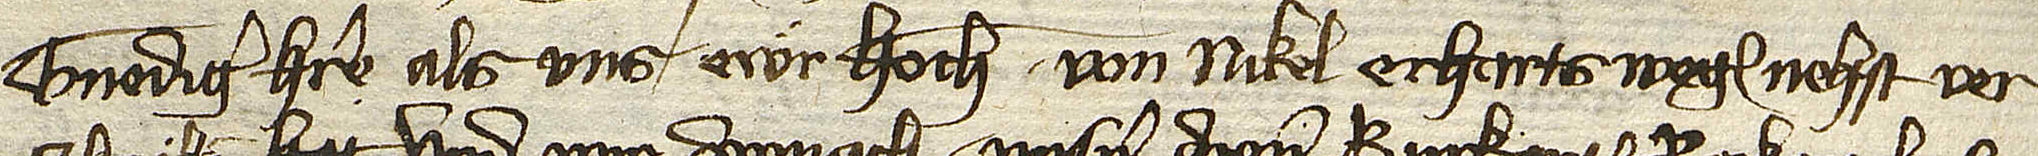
Gnedig* h*re als vns eẅr Hoch* / von Nikel erharts weg* nehſt ver
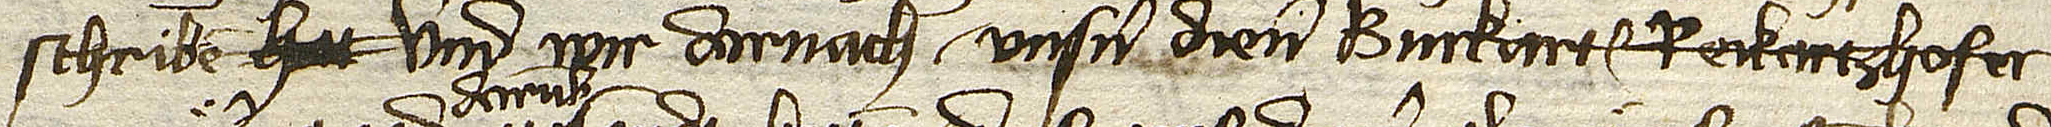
ſchribe* hat Vnd wir darnach / vnſn* dien* Burkart* Reikarcʒhofer
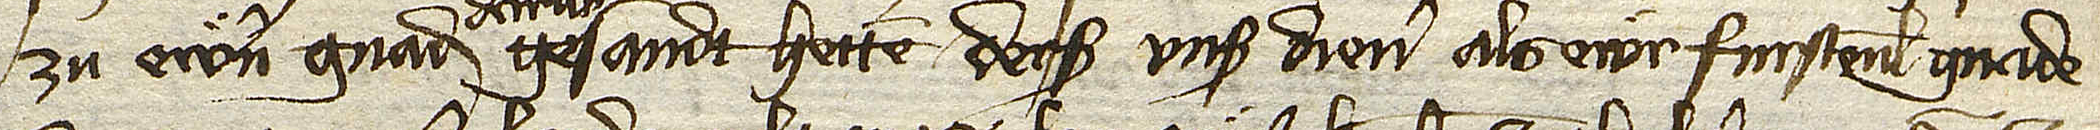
ʒu eẅ*n gnad* geſandt hette* / Derſ* vnſ* dien* als eẅr furſtenl* gnade
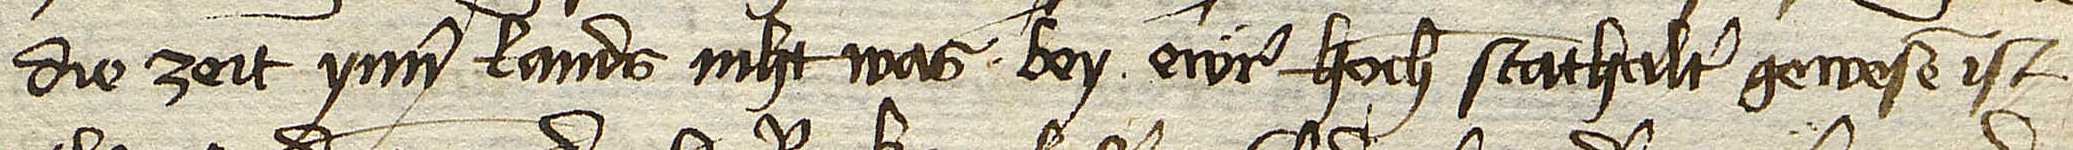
die ʒeit ynn* lands niht was . bey eẅr* hoch* ſtathalt* geweſe* iſt
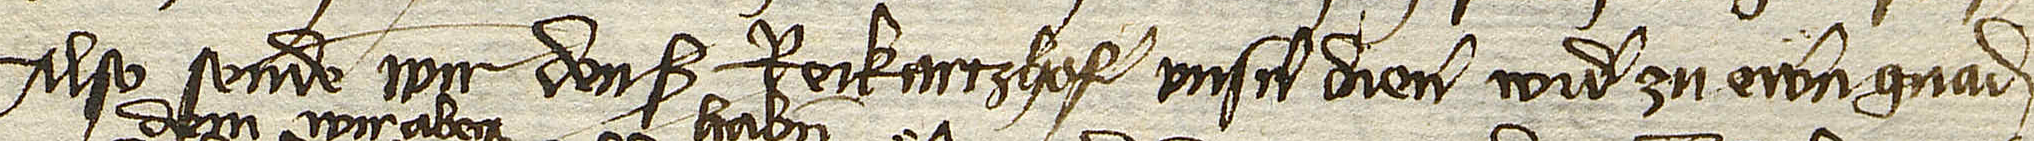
Alſo ſende* wir denſ* Reikarcʒhof* vnſn* dien* wid* ʒu eẅ*n gnad*
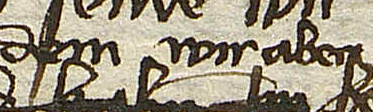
dem wir aber
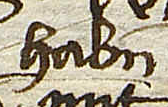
habn*
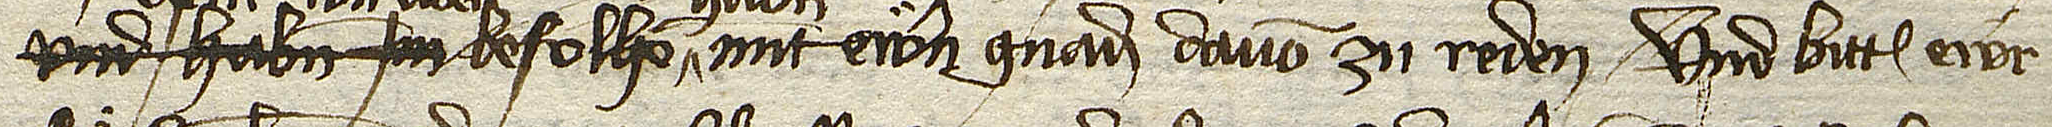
vnd habn* Im befolhe* mit eẅ*n gnad* dauo* ʒu reden / Vnd bitt* eẅr
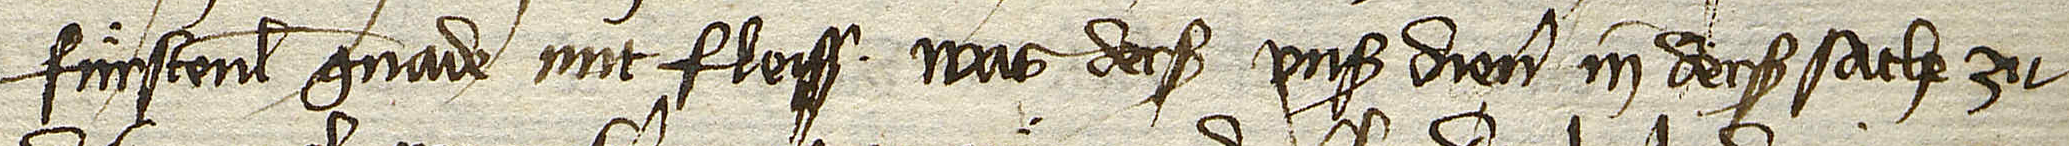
fürſtenl* gnade mit fleiſſ . was derſ* vnſ* dien* in derſ* ſache ʒu
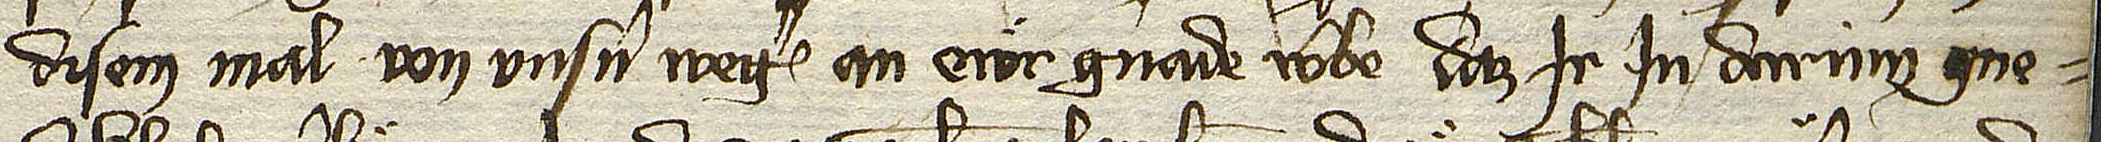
diſem mal . von vnſn* weg* an eẅr gnade w*be Daʒ Ir In darinn gne =
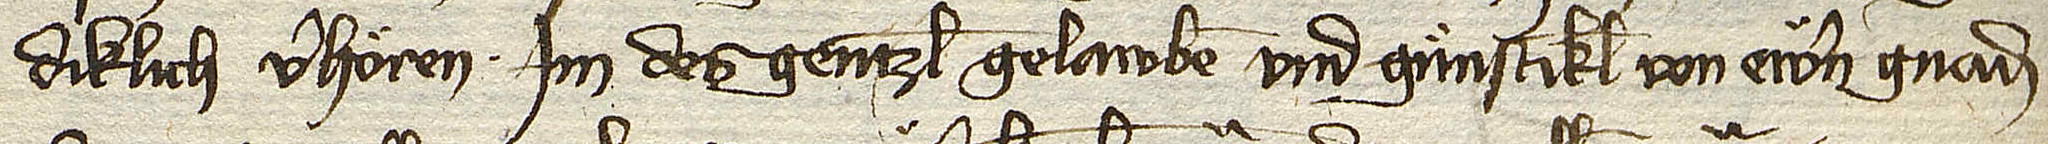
diklich v*hören . Im des gencʒl* gelawbe* vnd günſtikl* von eẅ*n gnad*
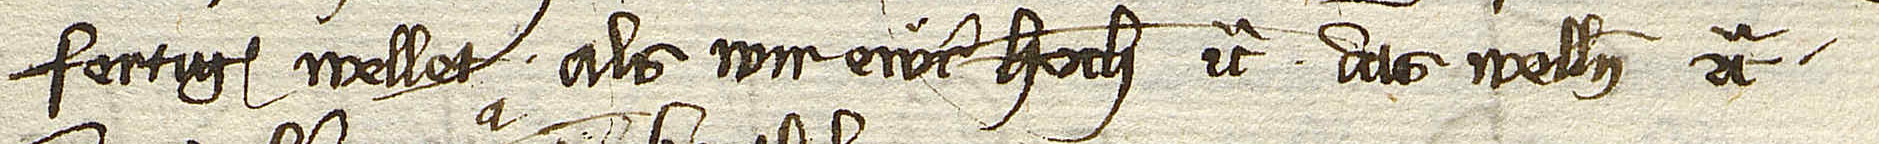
fertig* wellet / als wir eẅr* Hoch* ec* . das welln* ec* /
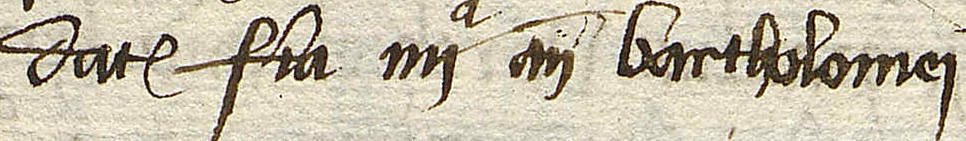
Dat* fi*a iiii* an* bartholomei
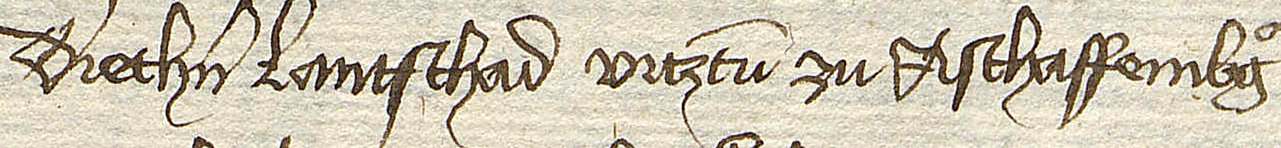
Diethn* Lantſchad vicʒtu* ʒu Aſchaffemb*g
